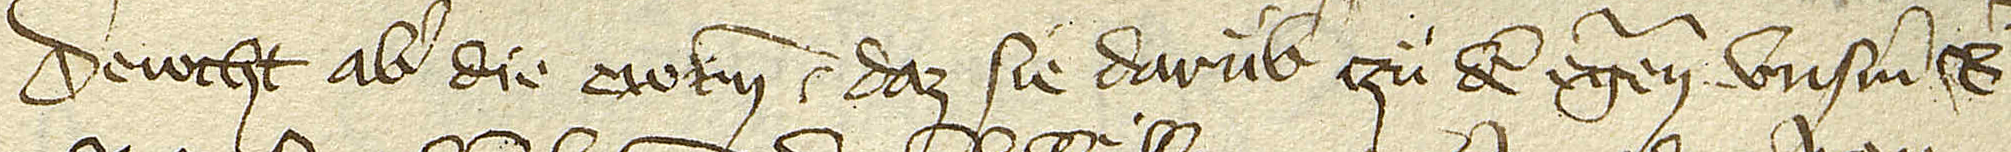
Dewcht ab* die ewrn* / daʒ ſie darüb* cʒü d* egen* vnſm* B*
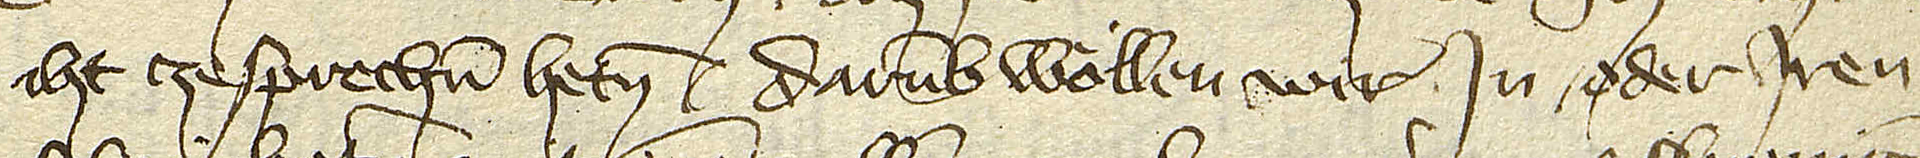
iht cʒeſprechn* hetn* / Darub* wöllen wir . In oder Iren
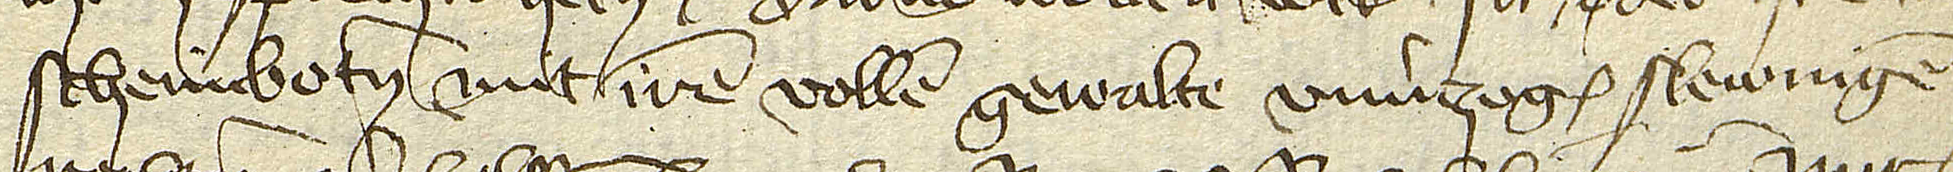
ſcheimbotn* mit ire* volle* gewalte vnu*cʒog* ſlewnige*
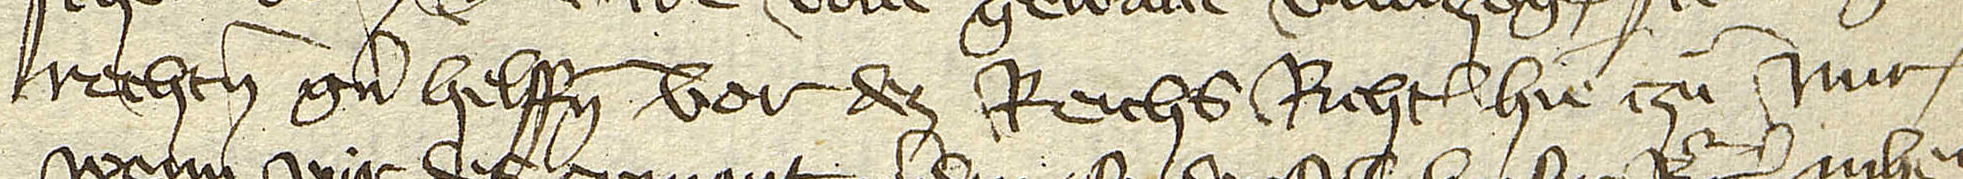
rechtn* gn* helffn* vor deʒ Reichs Richt* hie cʒü Nur*
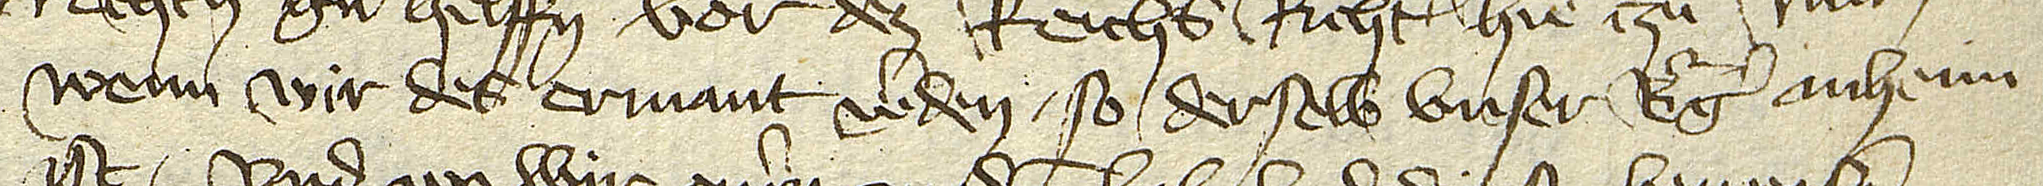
wenn wir des ermant w*den / ſo derſelb vnſer B*g* anheim
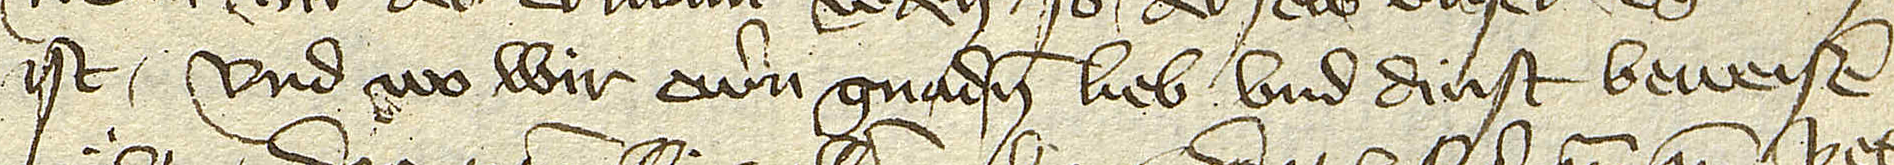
iſt / vnd wo wir ew*n gnadn* lieb vnd dinſt beweiſe*
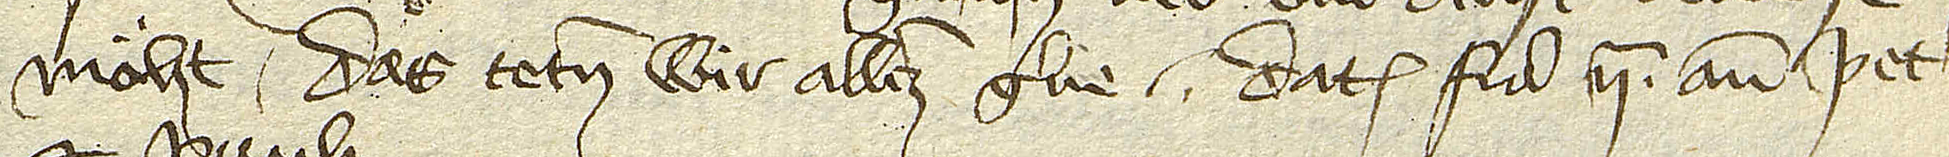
möht / Das tetn* wir allcʒ* g*ne / Dat* fia* ii* . an* Pet*
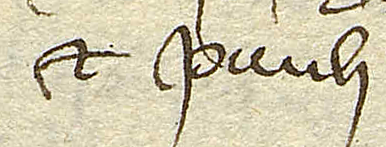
@ Pauli
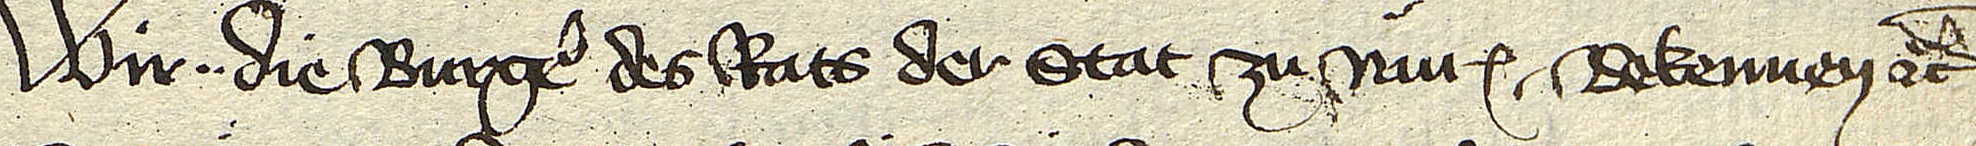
Wir ~ die Burge* des Rats der Stat cʒu Nür* / Bekennen ec*
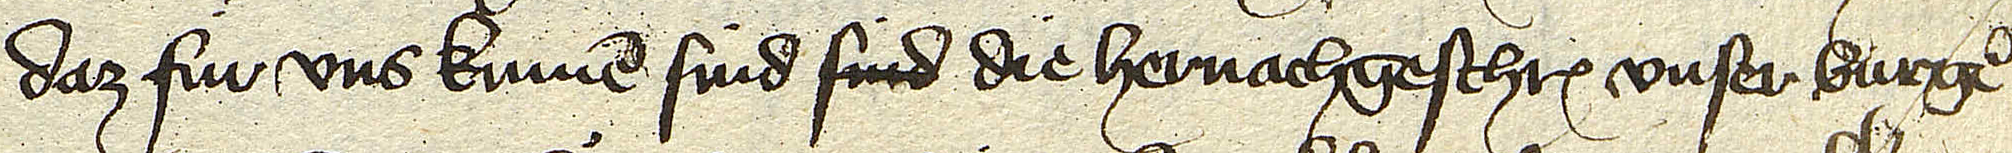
daʒ für vns kume* ſind ſind die hernachgeſchr* vnſer burge*
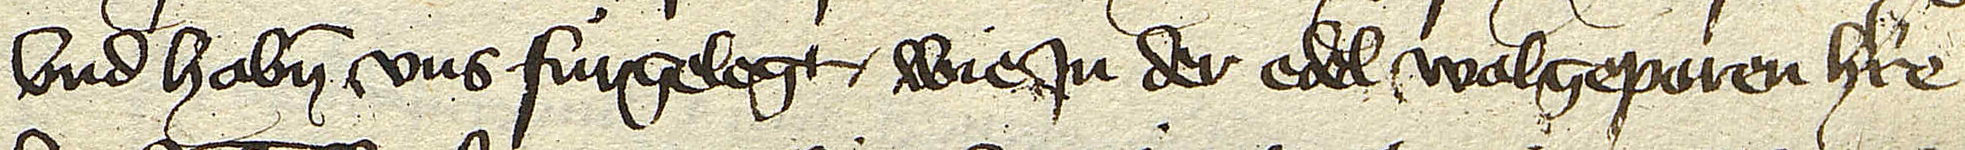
vnd habn* vns fürgelegt / wie In der edel wolgeporen h*re
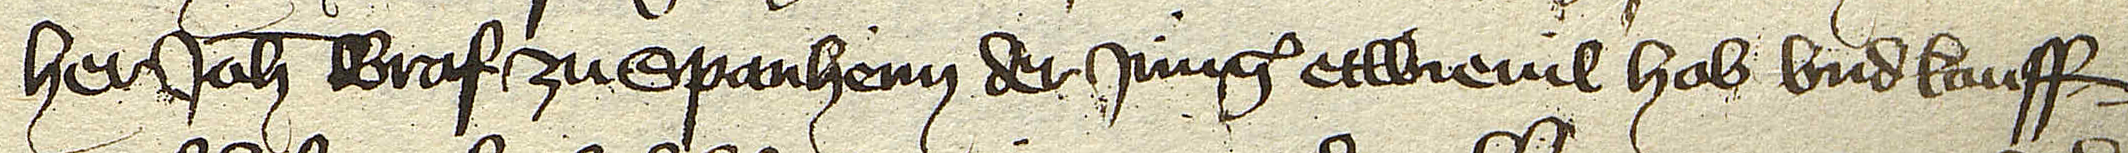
her Ioh* Graf cʒu Spanheim der Iüng* etwieuil hab vnd kauff =
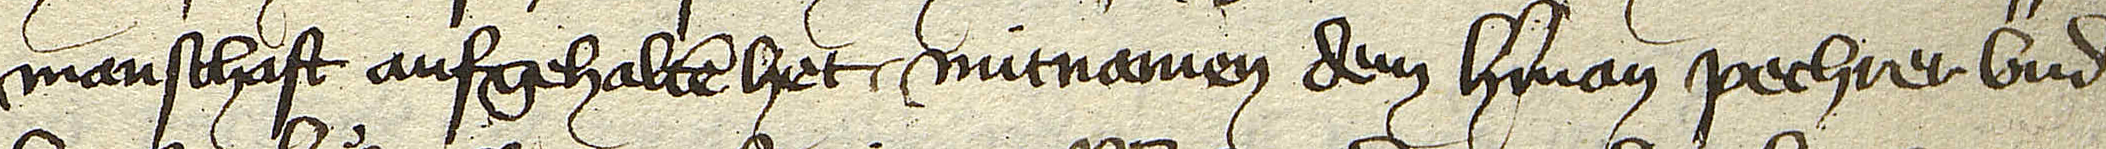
manſchaft aufgehalte* het / mitnamen dem h*man pechrer vnd
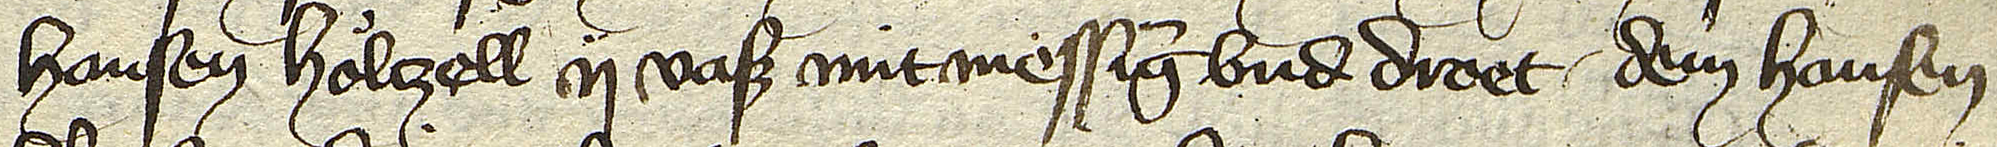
hanſen hölcʒell ii vaſʒ mit meſſig* vnd droet / dem hanſen
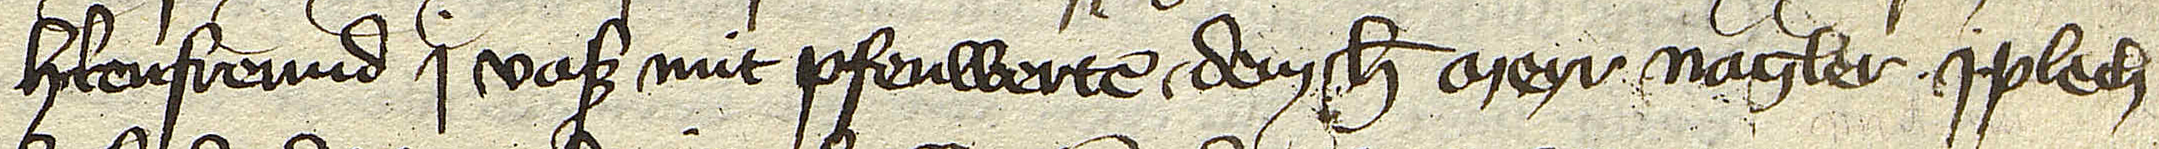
h*renfreund i vaſʒ mit pfenwerte* / dem h* Meyr Nagler . i . plech
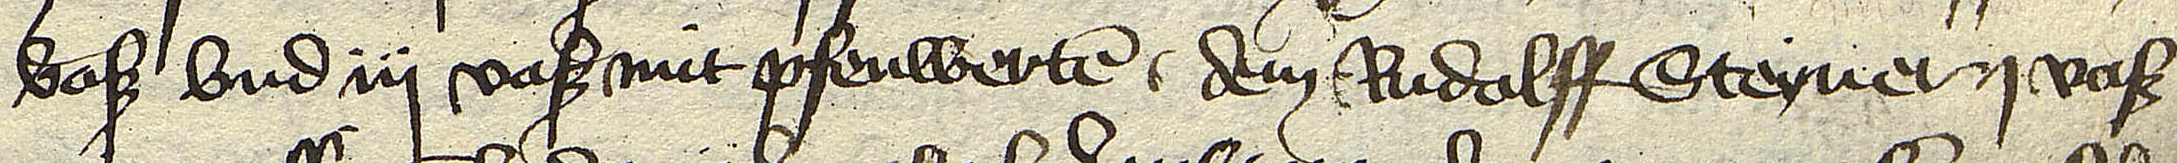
vaſʒ vnd iii vaſʒ mit pfenwerte* / dem Rudolff Steyner i vaſʒ
